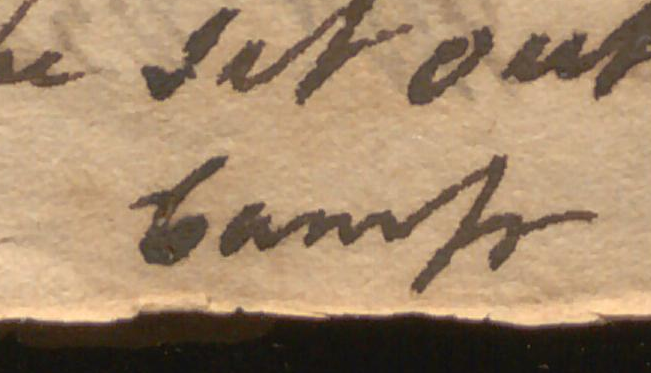Camp
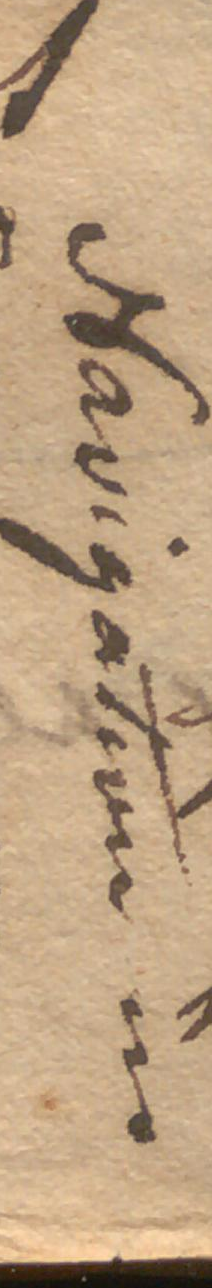Navigation in
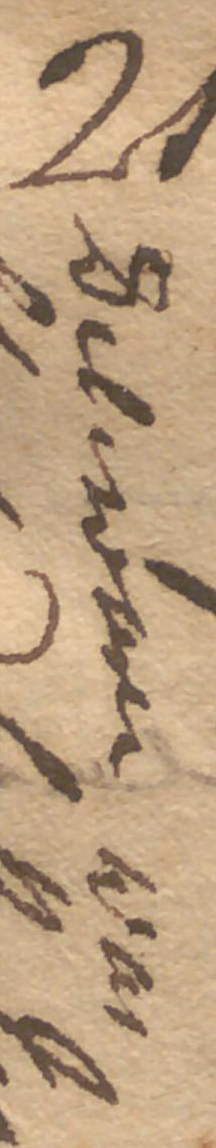Deleware was
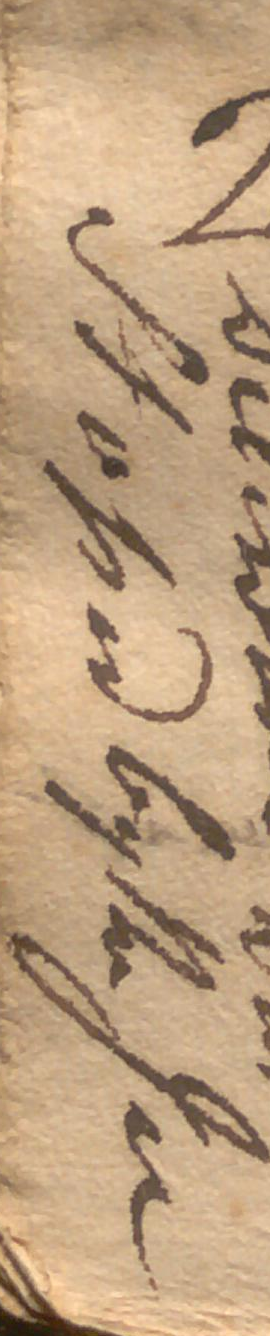Stoped by the Ice
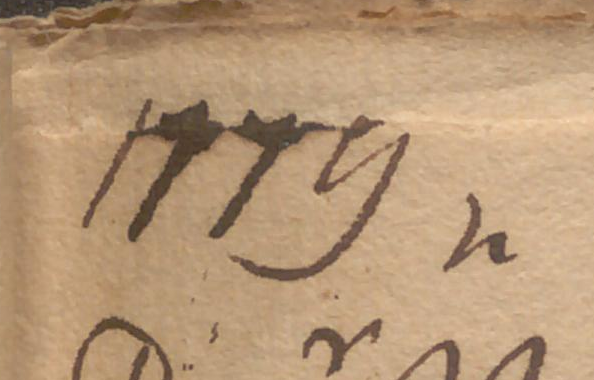1779
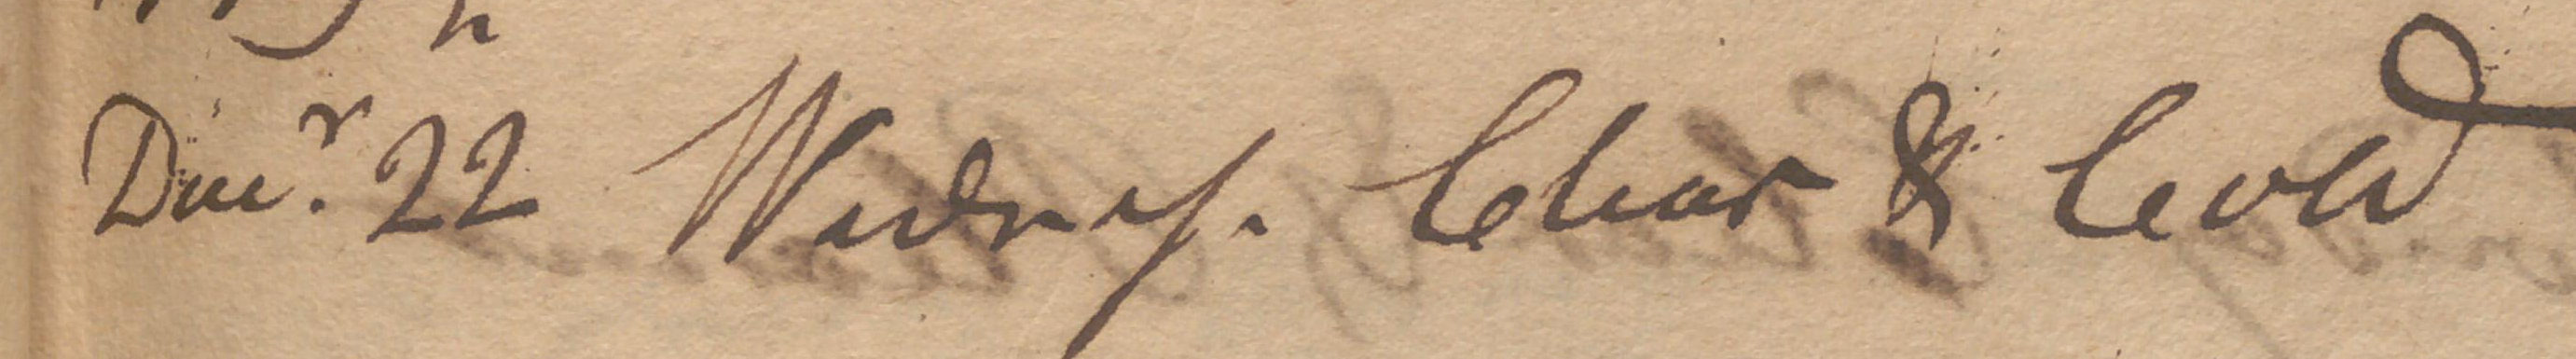Dec^r. 22 Wednes. Clear & Cold
